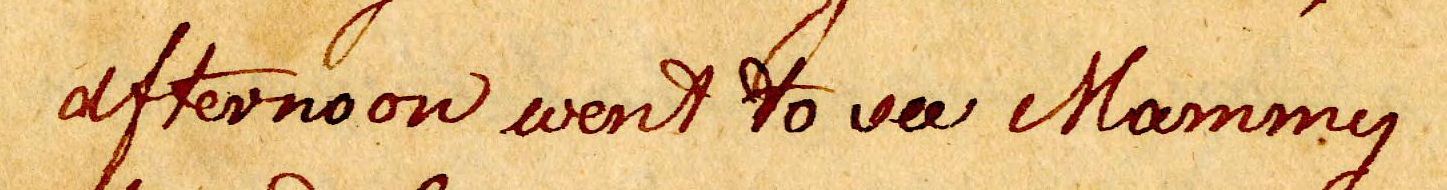afternoon went to see Mammy
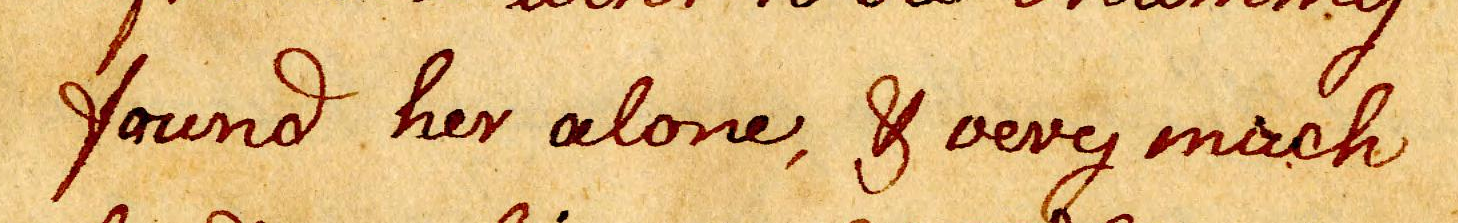found her alone, & very much
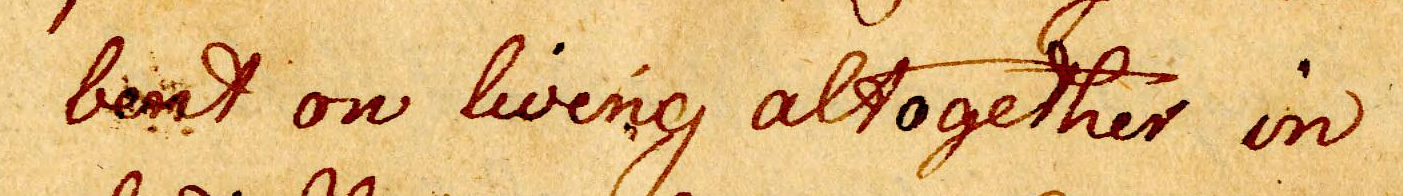bent on living altogether in
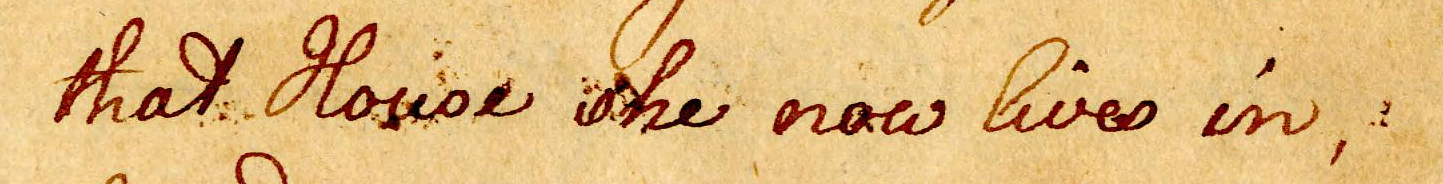that House she now lives in,
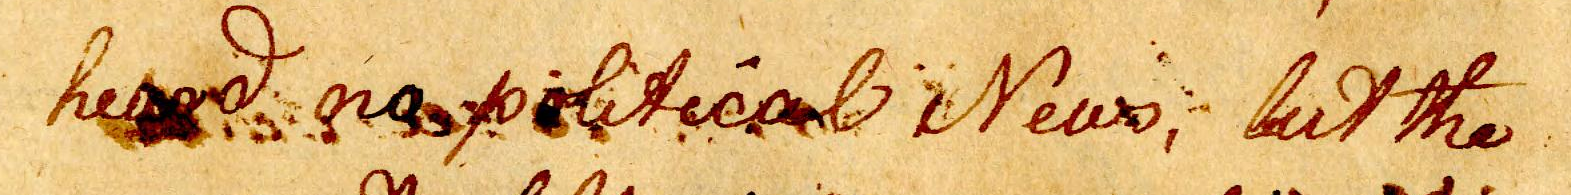heard no political News, but the
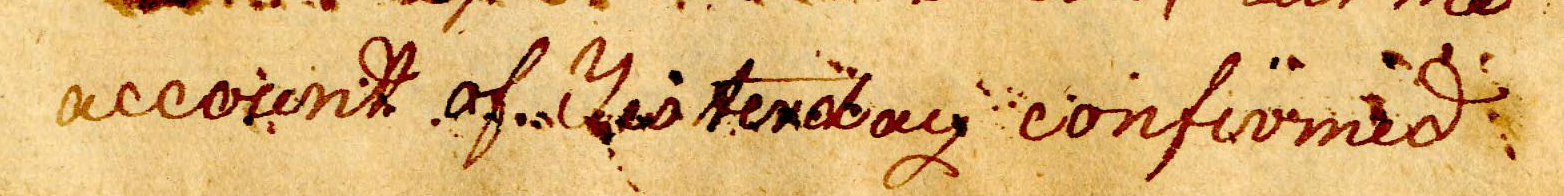account of Yesterday confirmed
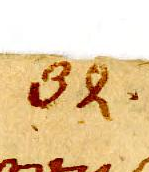32
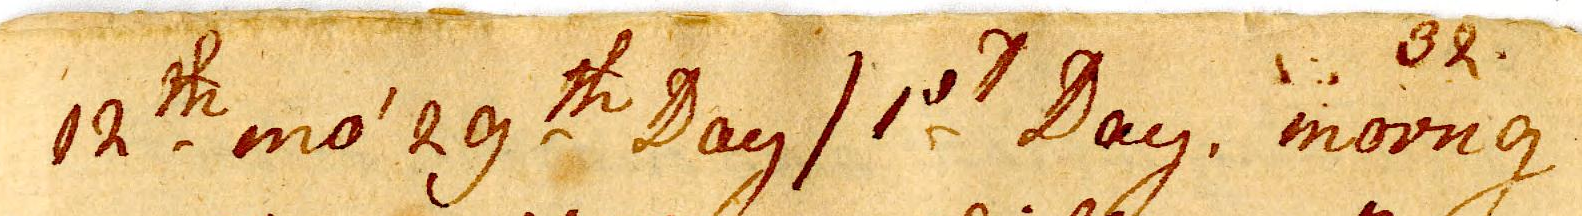12^th mo' 29^th Day ) 1^st Day. morng
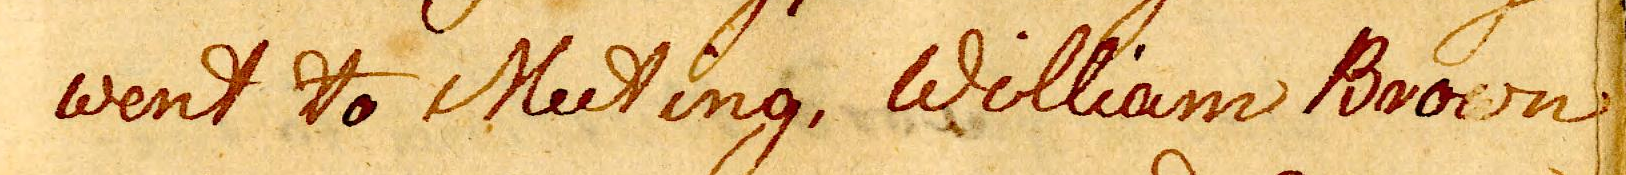went to Meeting, William Brown
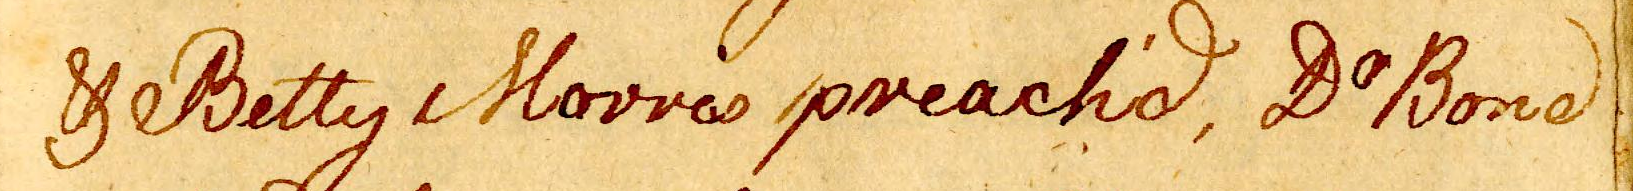& Betty Morris preach'd, D^r Bond
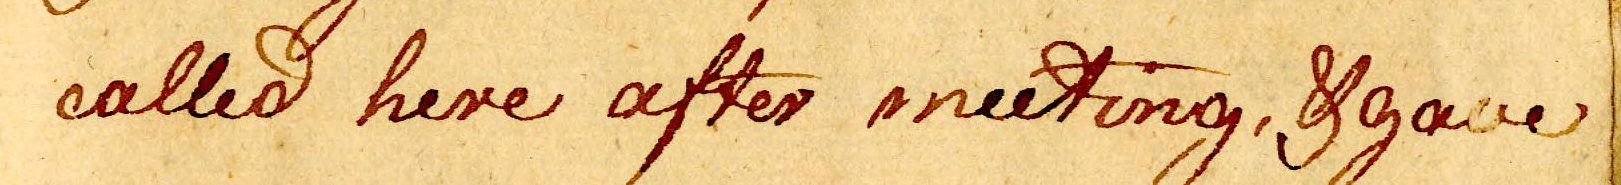called here after meeting, & gave
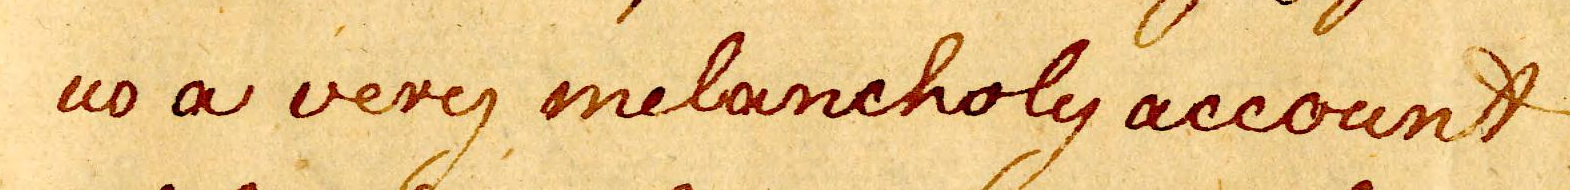us a very melancholy account
